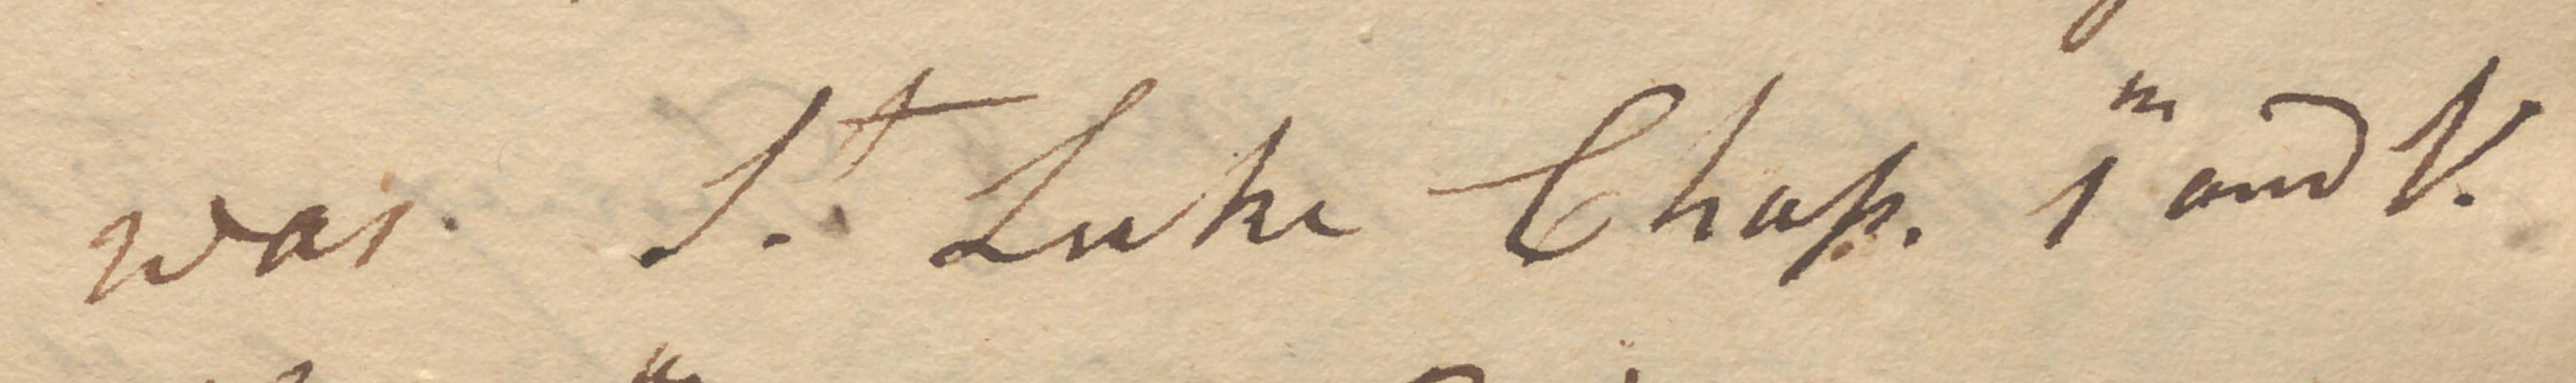was. S^d. Luke Chap. 1^th and V.
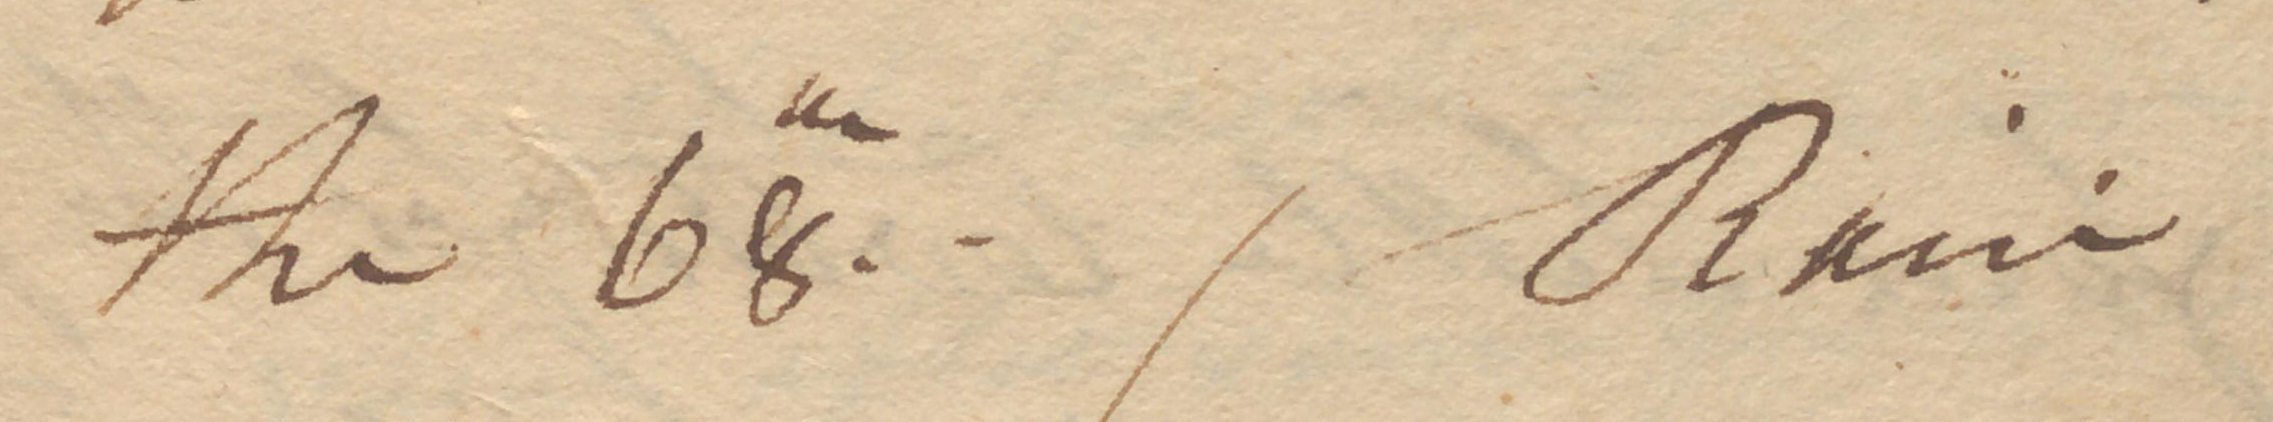the 68^th. / Rain
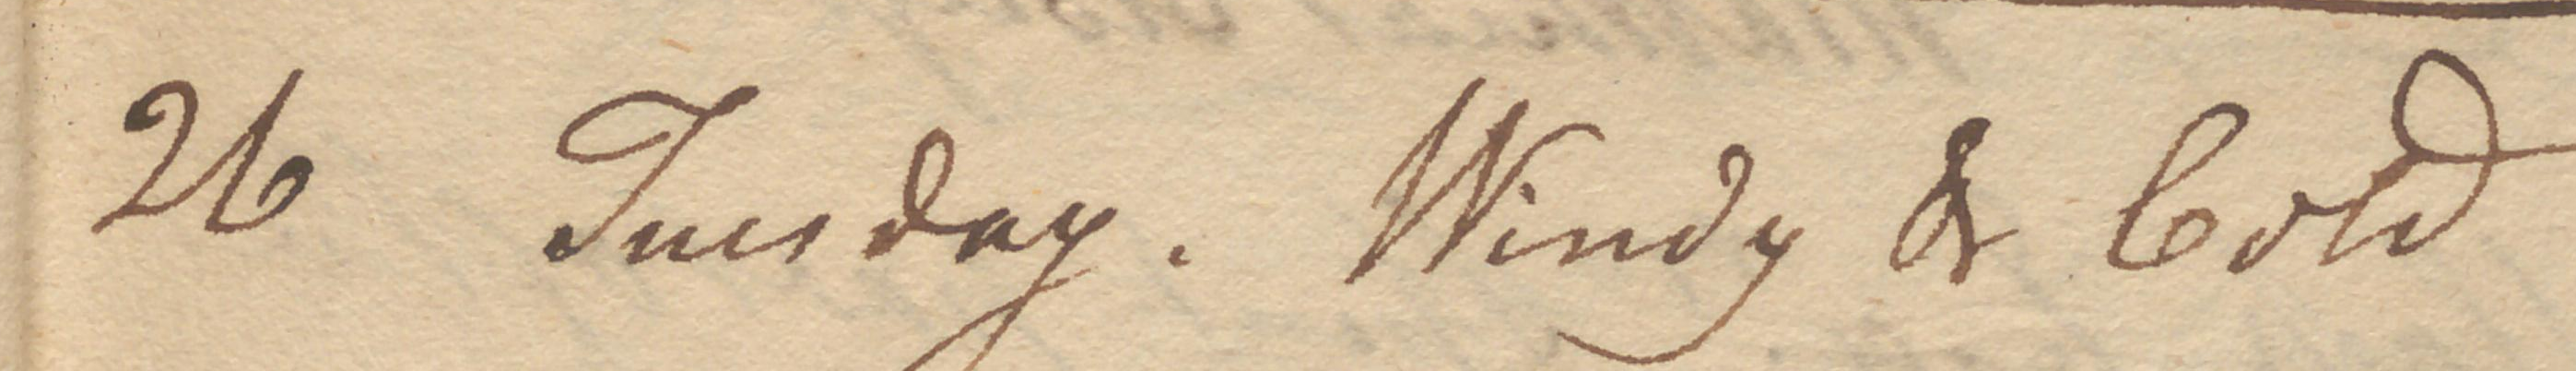26 Tuesday. Windy & Cold
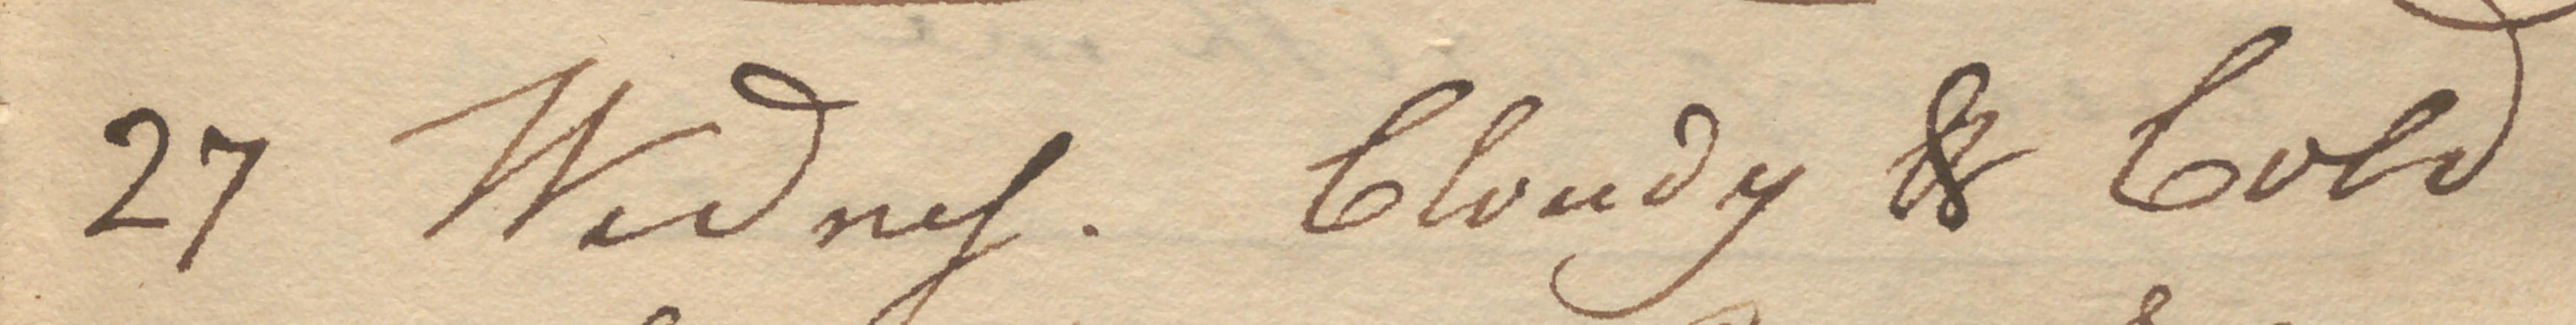27 Wednes. Cloudy & Cold
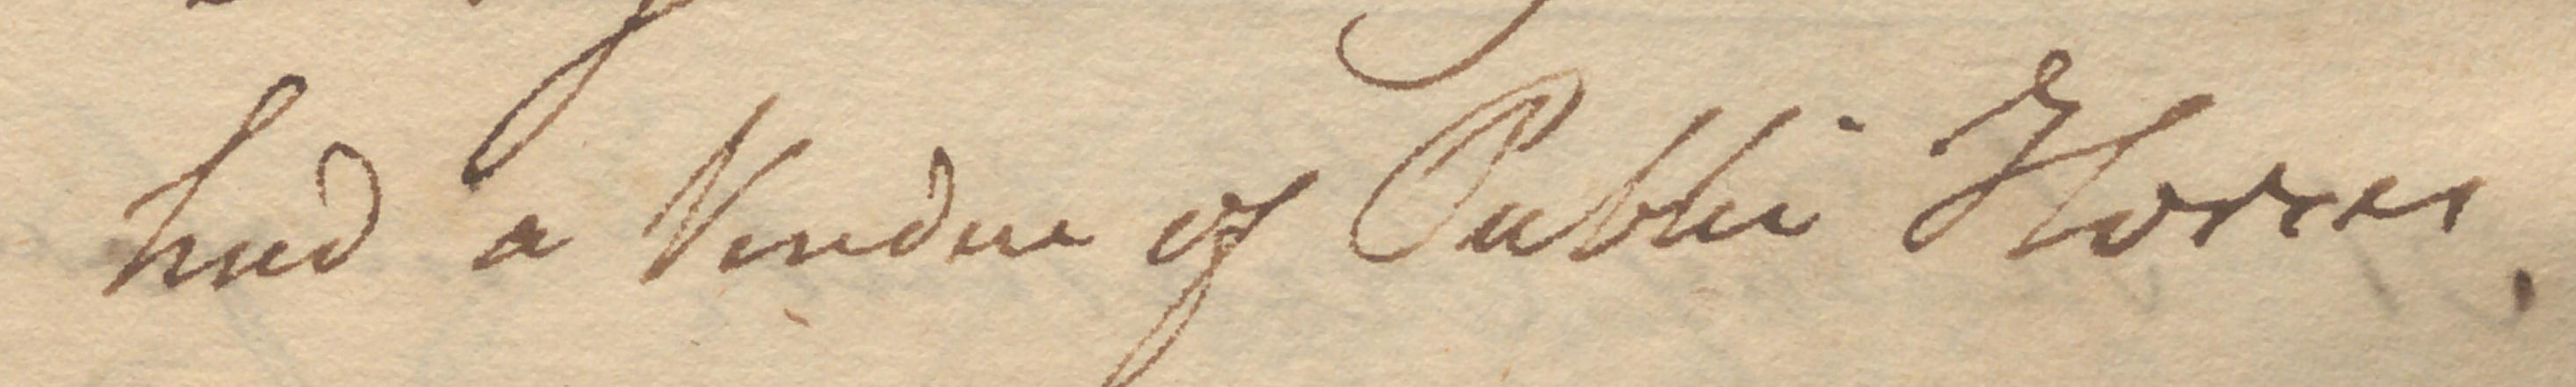had a Vendue of Public Horses
